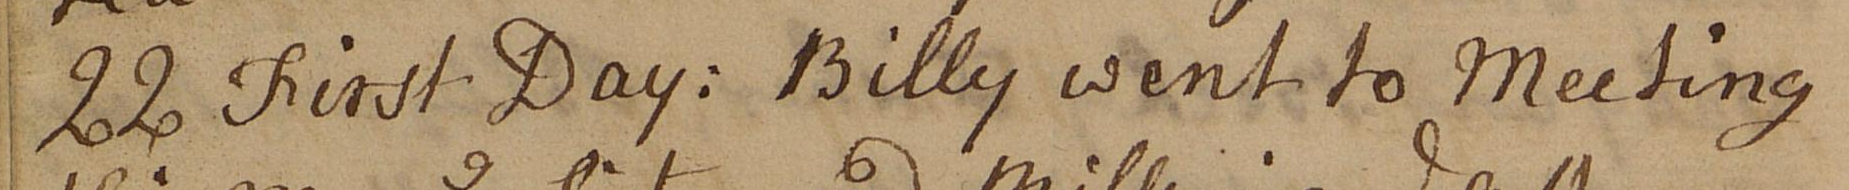22 First Day: Billy went to Meeting
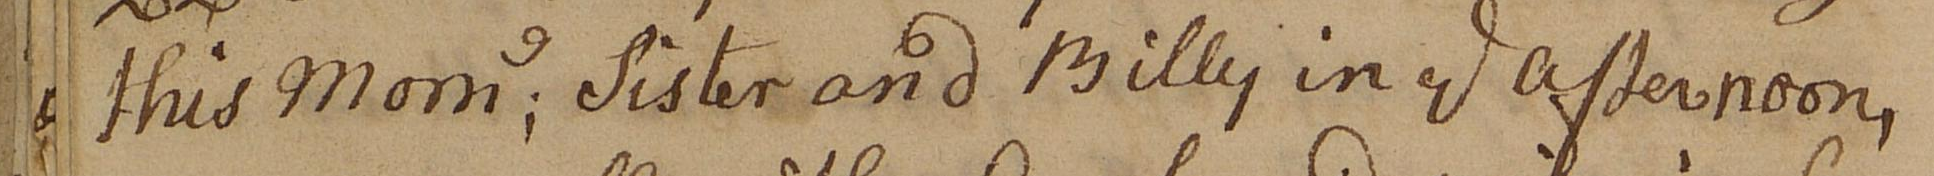this Morn^g., Sister and Billy in y^e Afternoon,
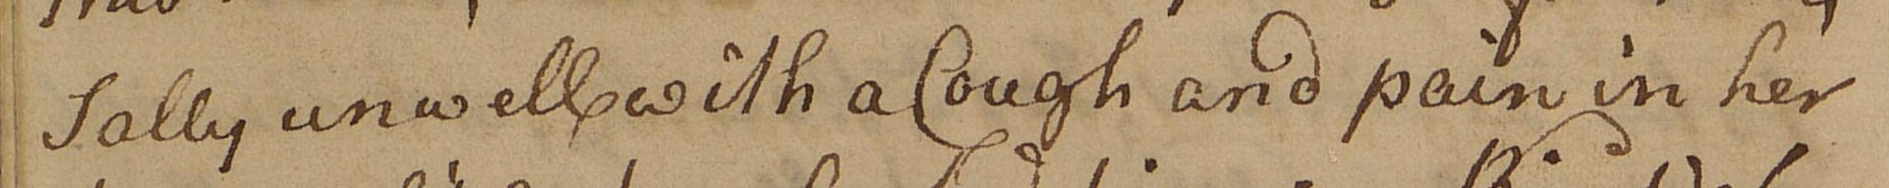Sally unwell with a Cough and pain in her
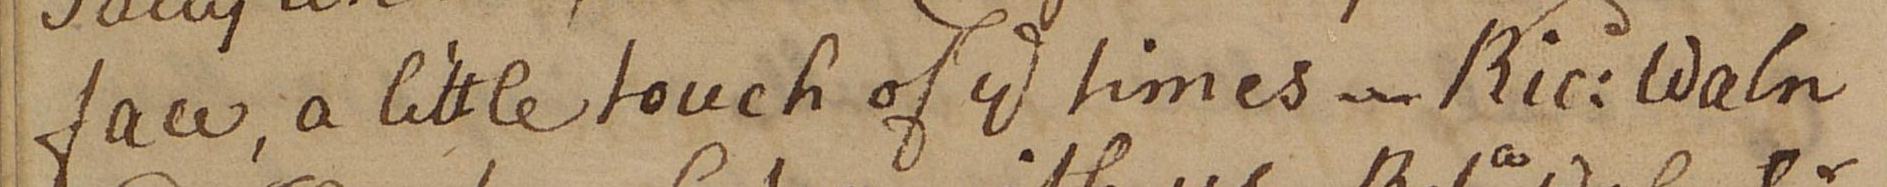jaw, a little touch of y^e times- Ric^d: Waln
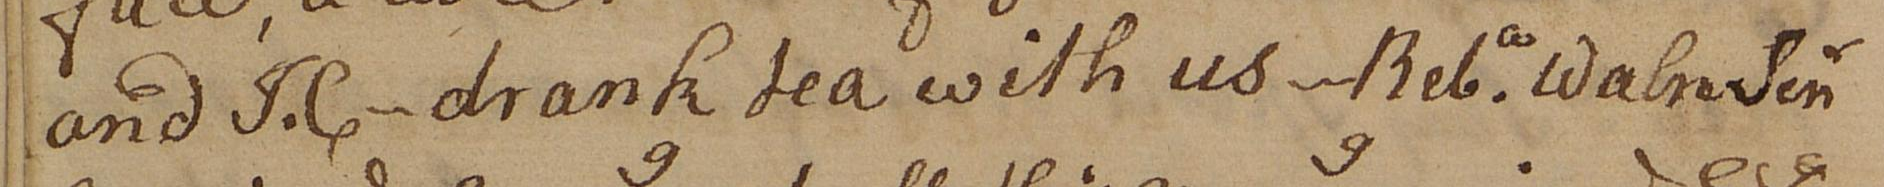and J.C- drank tea with us- Reb^a. Waln Sen^r
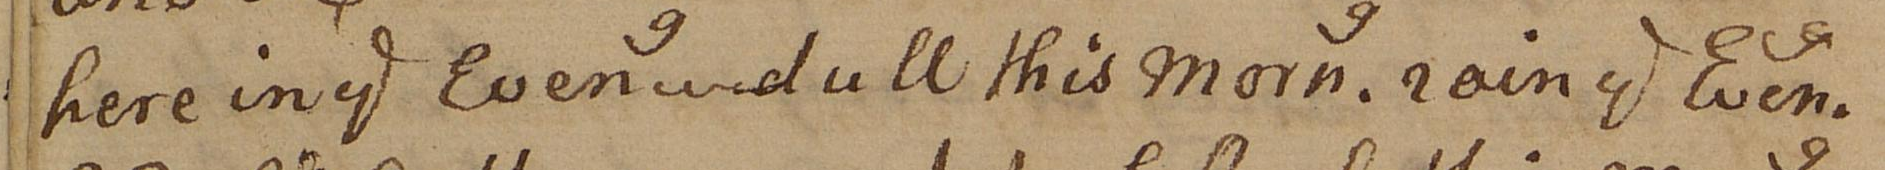here in y^e Even^g - dull this morn^g. rainy Even^g.
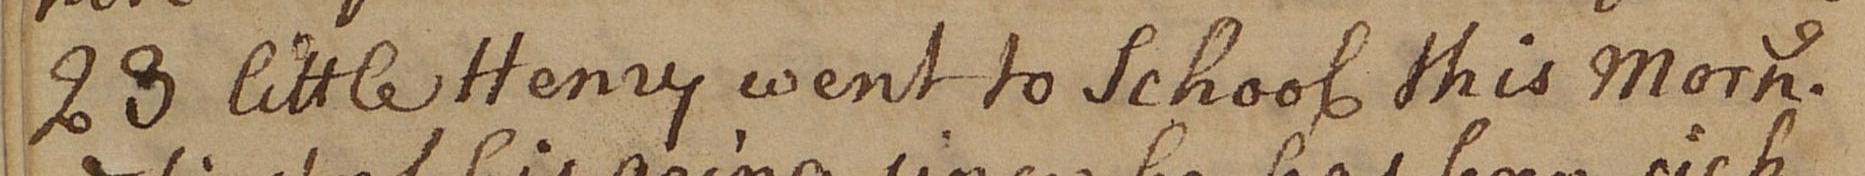23 little Henry went to School this Morn^g.
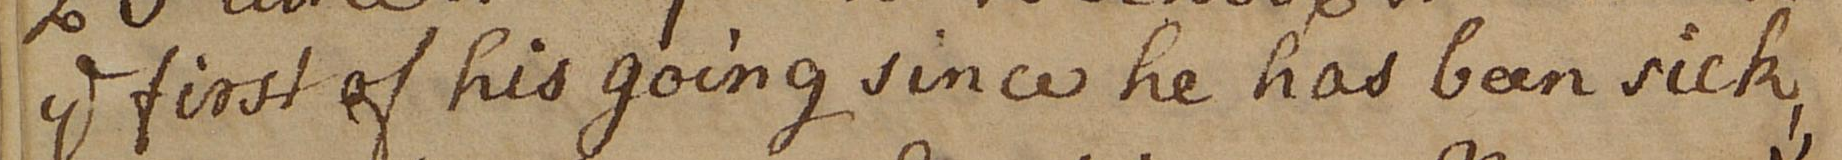y^e first of his going since he had been sick,
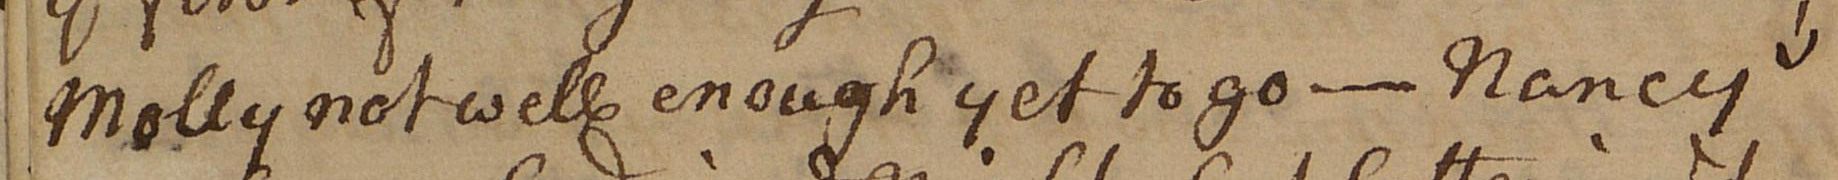Molly not well enough yet to go- Nancy^s
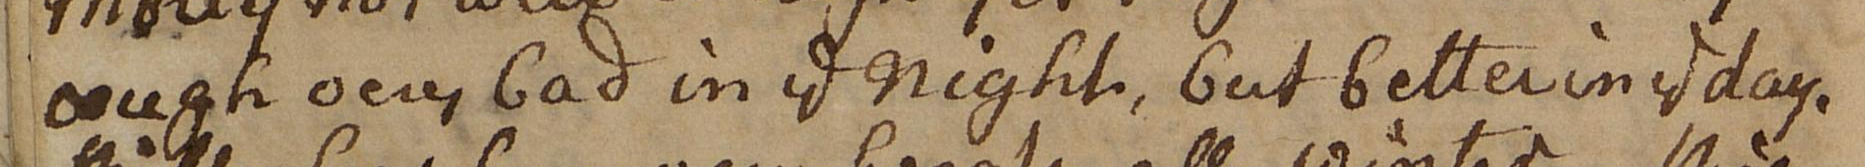cough very bad in y^e night, but better in y^e day.
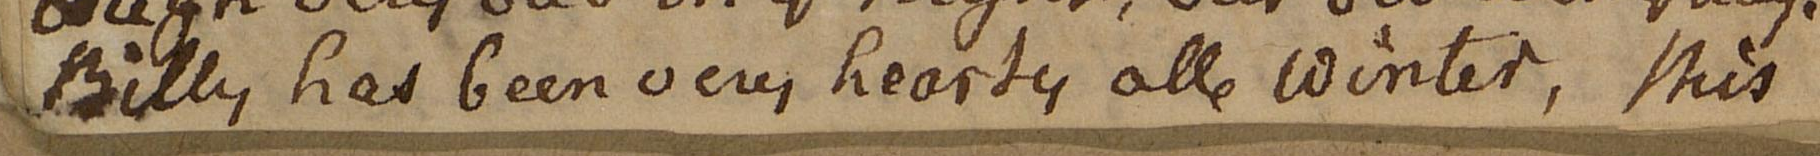Billy has been very hearty all winter, this
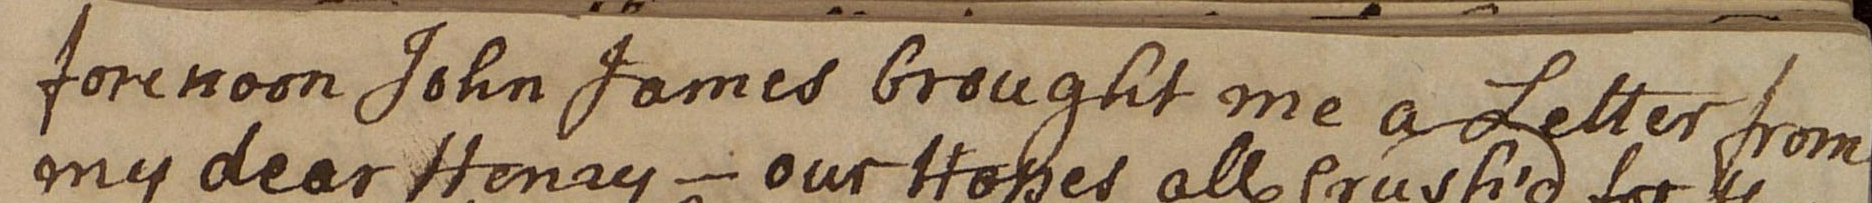forenoon John James brought me a Letter from
